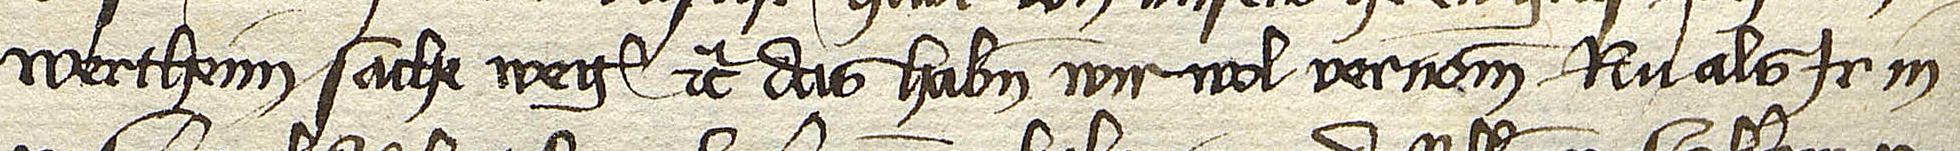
wertheim ſache weg* ec* das habn* wir wol vernom* Nu als Ir in
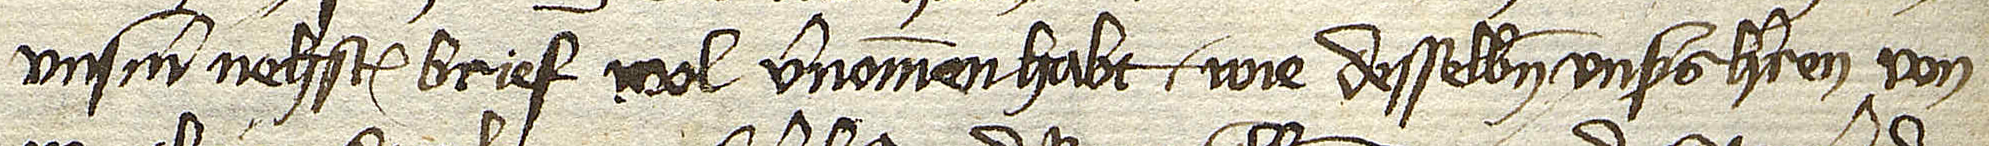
vnſm* nehſt* brief wol v*nom*en habt / wie deſſelbn* vnſ*s h*ren von
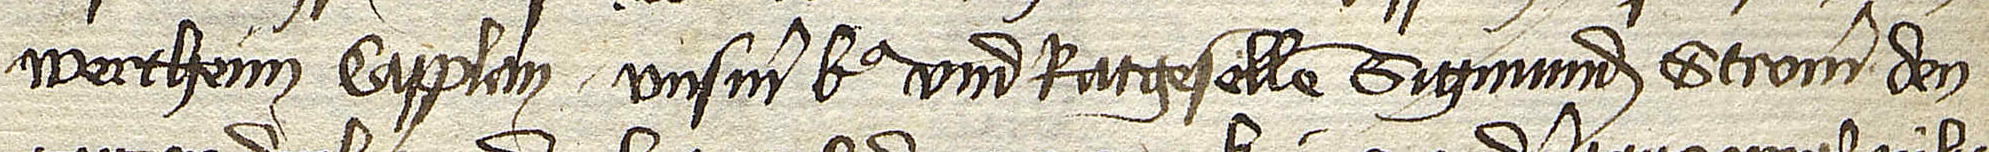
wertheim Capplan / vnſm* b* vnd Ratgeſelle* Sigmund* Strom* den
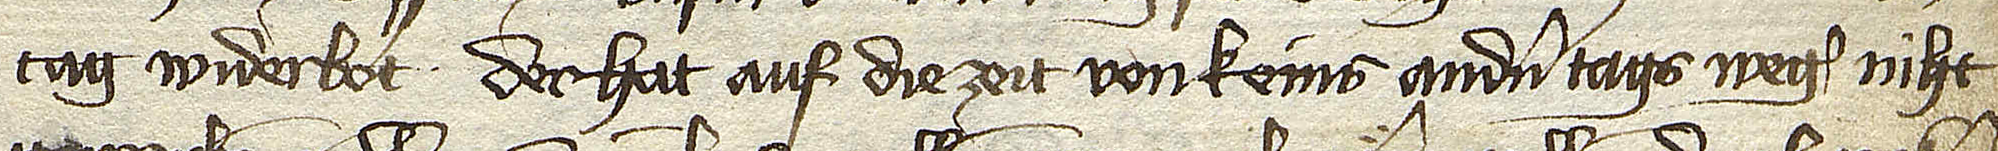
tag widerbot . Der hat auf die ʒeit von eins andn* tags weg* niht
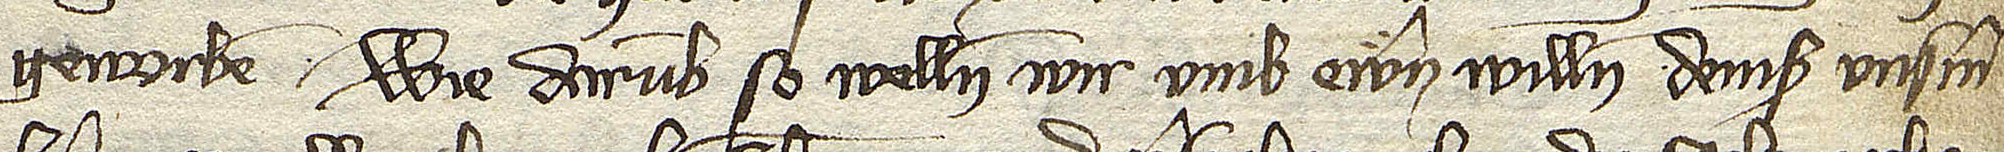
geworbe* / Wie darub* ſo welln* wir vmb eẅ*n willn* demſ* vnſm*
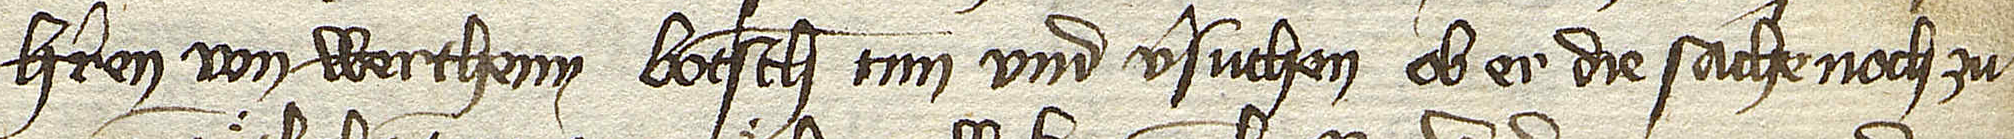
H*ren von wertheim botſch* tun vnd v*ſuchen ob er die ſache noch ʒu
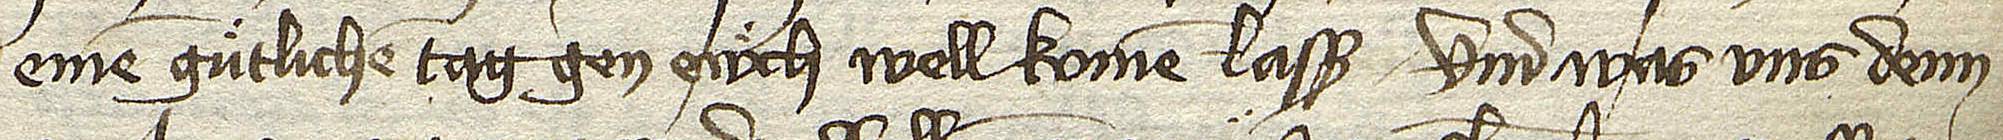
eine* gütliche* tag gen eẅch well kome* laſſ* / Vnd was vns denn
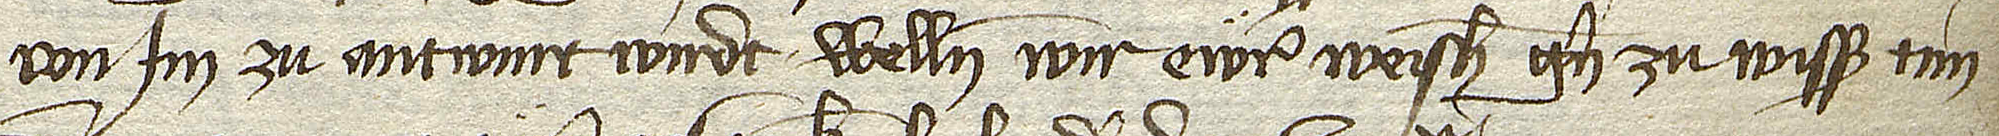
von Im ʒu antwurt wirdt / welln* wir eẅr* weiſh* g*n ʒu wiſſ* tun
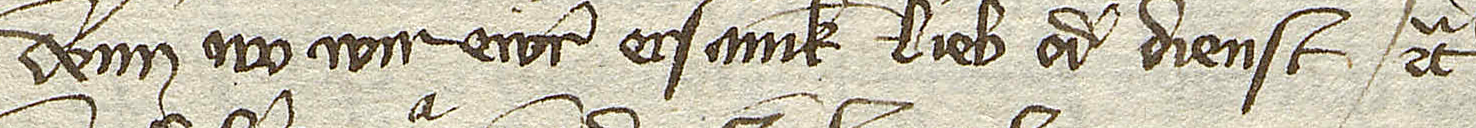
Denn wo wir eẅr* erſamk* lieb od* dienſt ec*
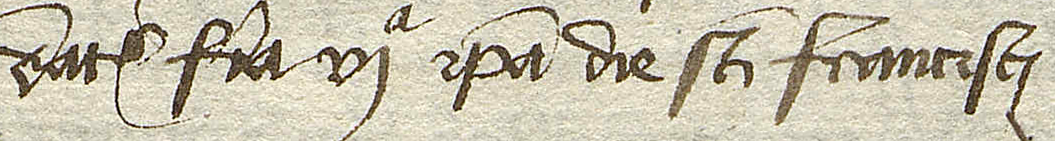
Dat* fi*a vi* ipa* die ſci* Franciſti
